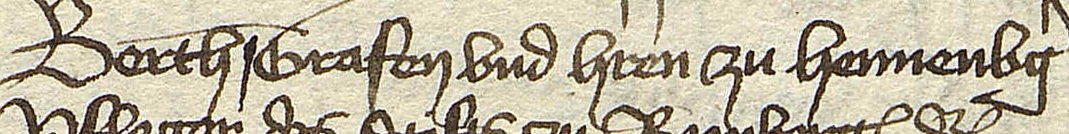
Berth / Grafen vnd hr*en cʒu hennenbg*
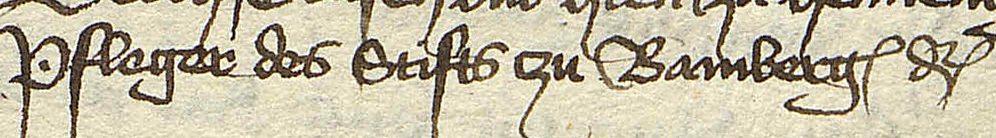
Pfleger des Stifts cʒu Bamberg* %
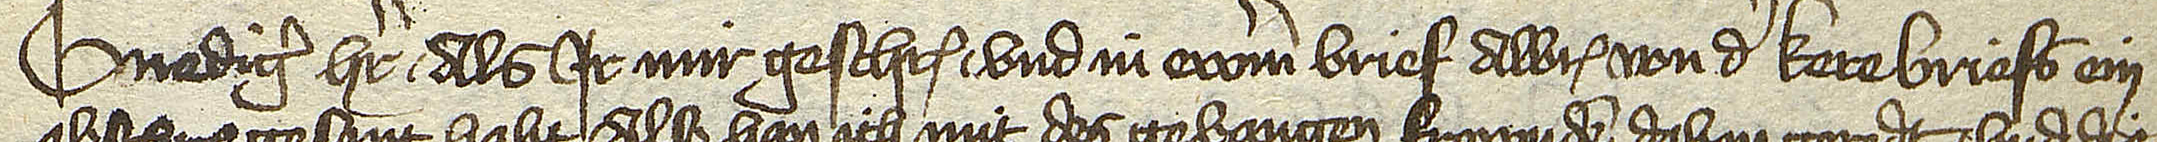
Gnedig* hr* / Als ir mir geſchr* / vnd in ewm* brief Albr* von d* Kere briefs ein
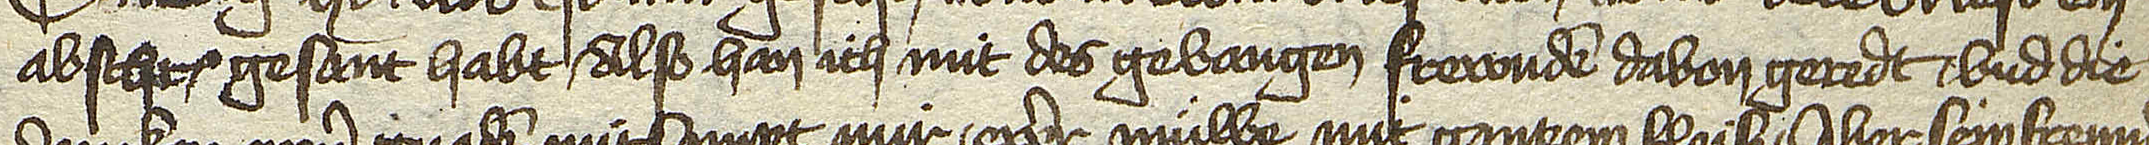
abſchr* geſant habt / Alſo han ich mit des gevangen frewnde* davon geredt / vnd die
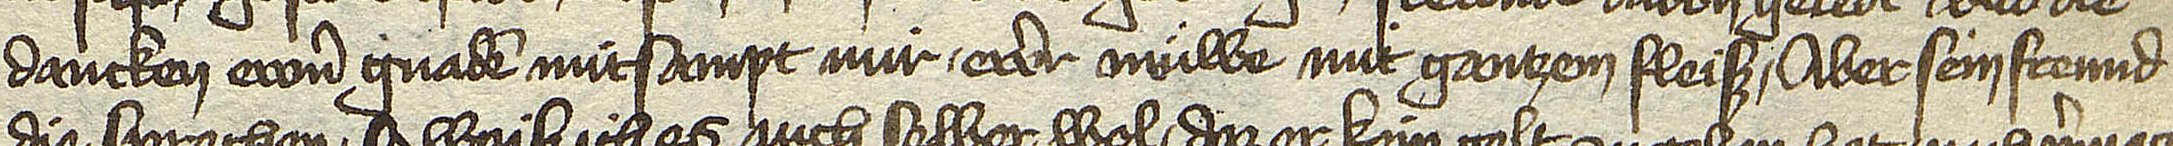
dancken ewn* gnade* mitſampt mir / ew*r müwe mit gantʒem fleiſʒ / Aber ſein freund
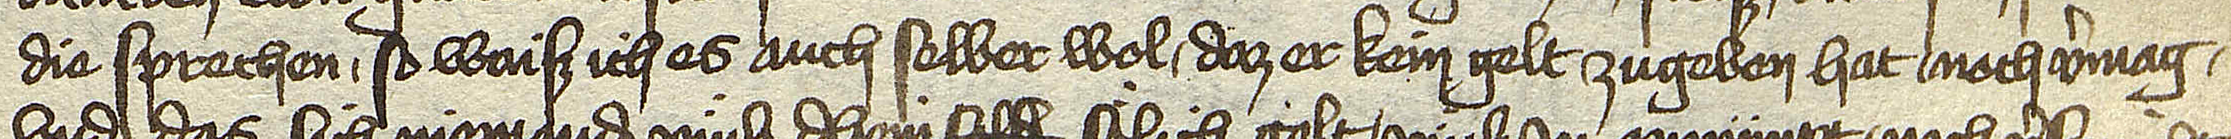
die ſprechen / ſo waiſʒ ich es auch ſelber wol / daʒ er kein gelt cʒugeben hat / noch v*mag /
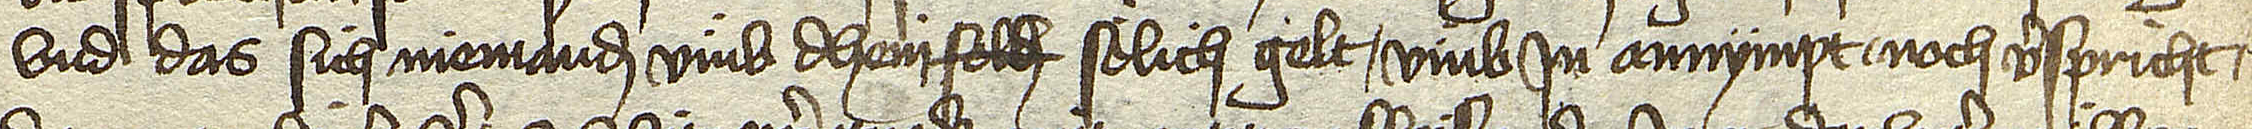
vnd das ſich niemand* v̈mb dhein ſolh ſölich gelt / v̈mb In annympt / noch v*ſpricht /
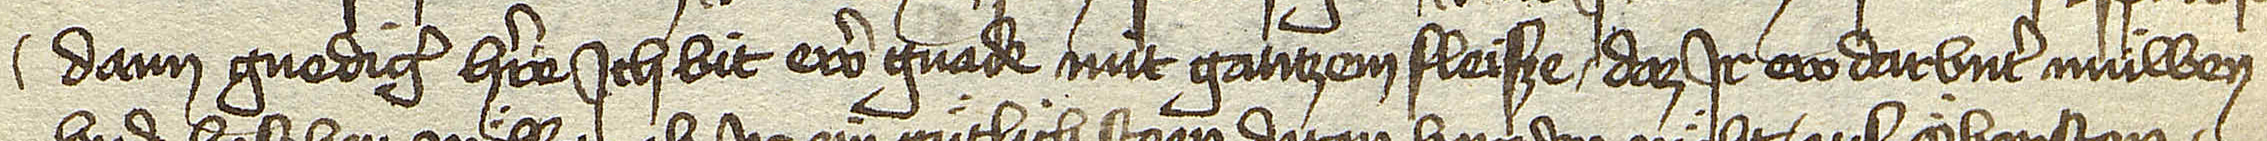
/ dann gnedig* h*re Ich bit ew* gnade mit gantʒem fleiſʒe / daʒ Ir ew darvnt* müwen
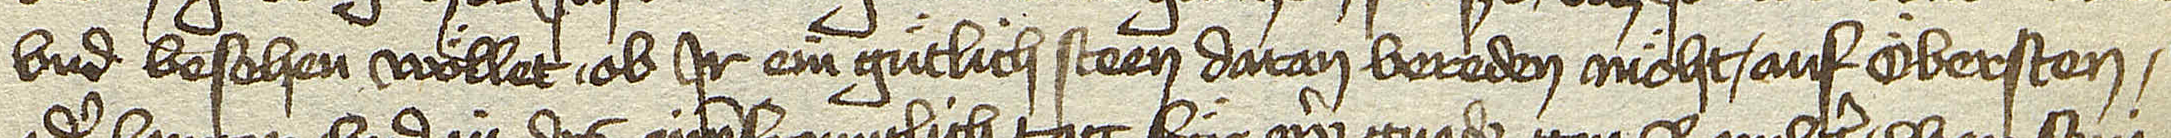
vnd beſehen wöllet / ob Ir ein gütlich ſteen daran bereden möht / auf Öberſten /
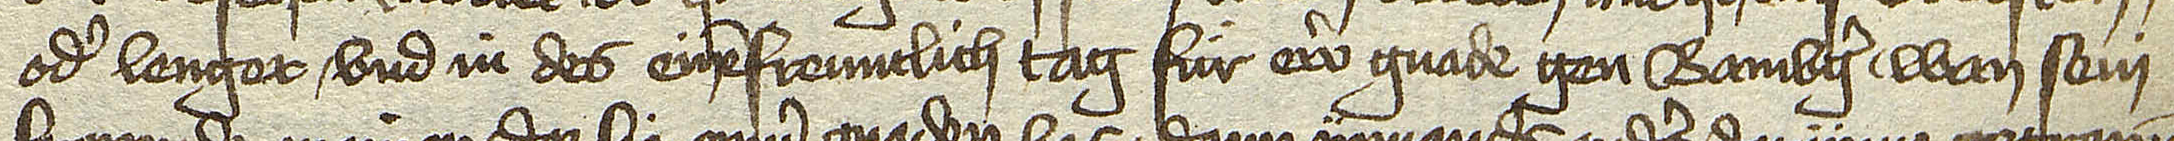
od* lenger / vnd in des eine* freuntlich tag für ew* gnade gen Bambg* / wan ſein
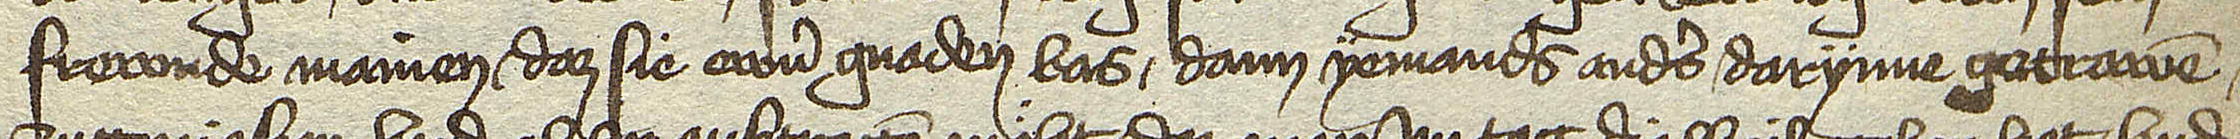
frewnde mainen / daʒ ſie ewn* gnaden bas / dann yemands ands* darynne getrawe*
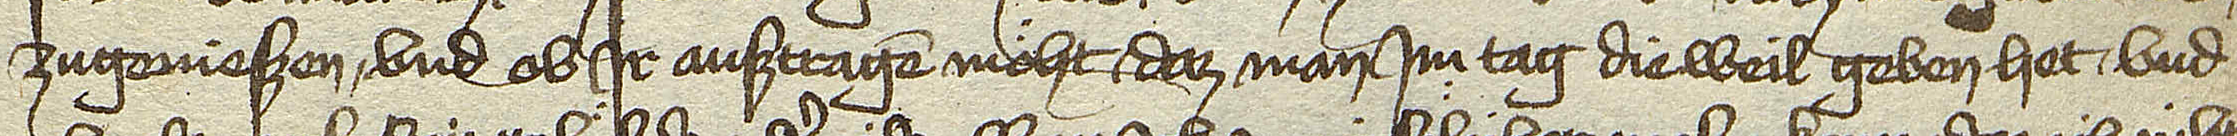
cʒugenieſʒen / vnd ob Ir auſʒtrage* möht / daʒ man Im tag dieweil geben het / vnd
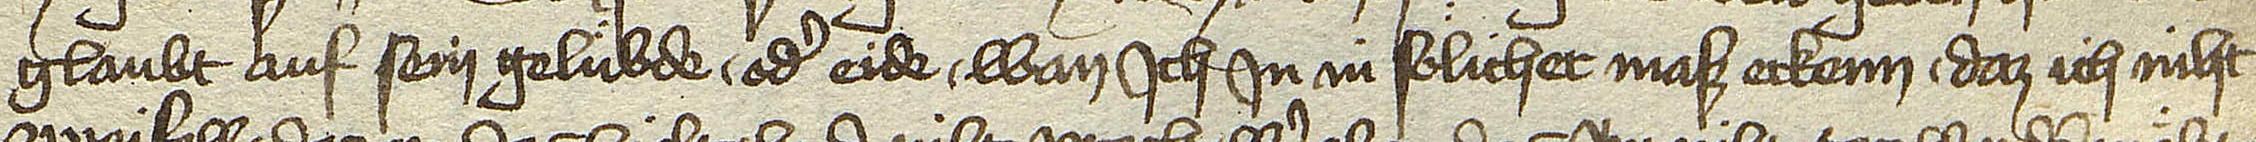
glaubt auf ſein gelübde / od* eide / wan Ich In in ſölicher maſʒ erkenn / daʒ ich niht
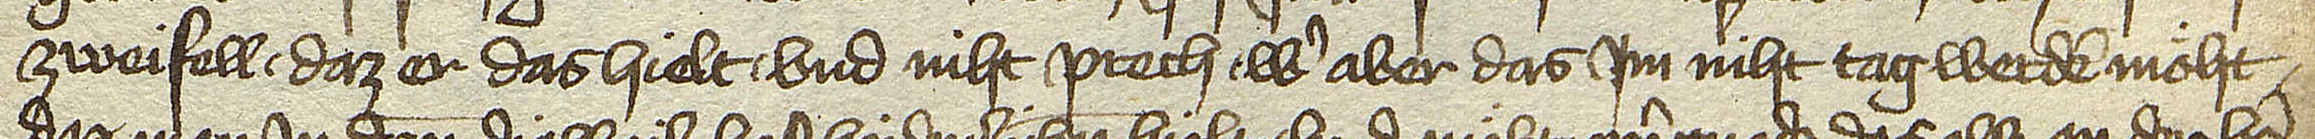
cʒweifell / daʒ er das hielt / vnd niht prech / w* aber das Im niht tag werde* möht /
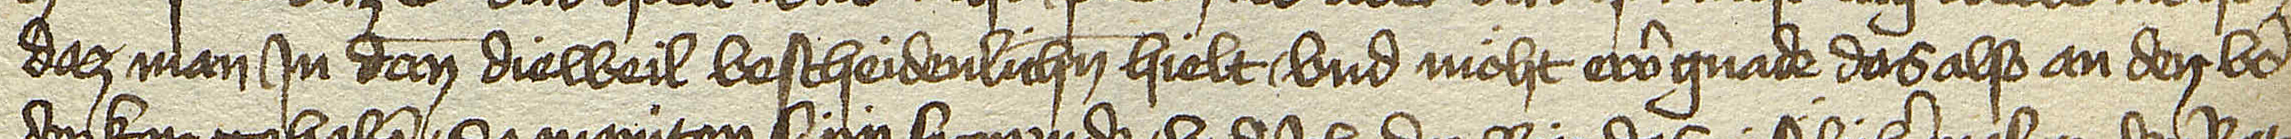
daʒ man In dan dieweil beſcheidenlichn* hielt / vnd möht ew* gnade das alſo an den vo*
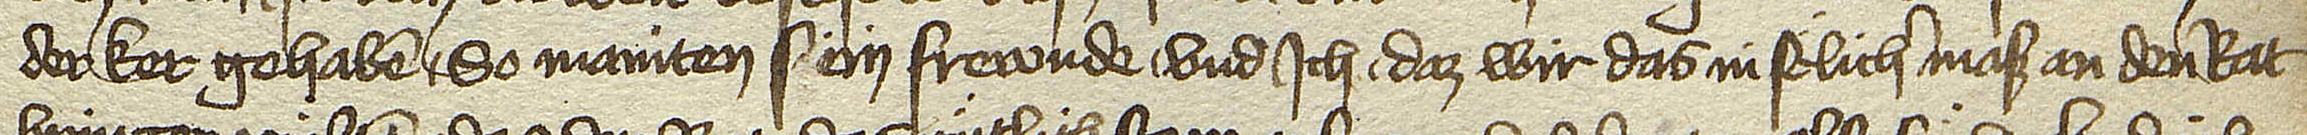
der ker gehabe* / So mainten ſein frewnde / vnd Ich / daʒ wir das in ſölich* maſʒ an den Rat
